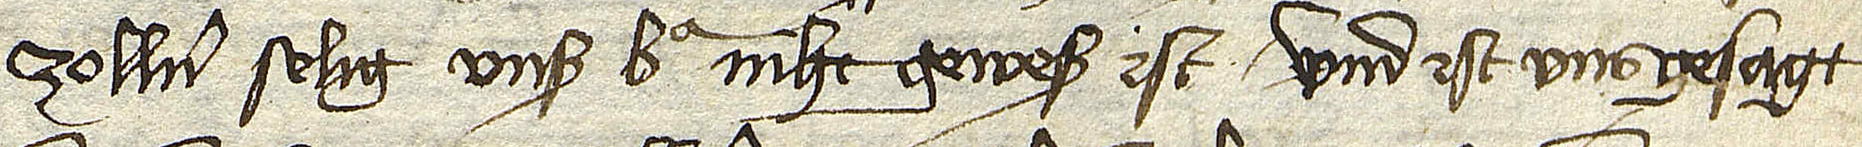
cʒolln* ſelig vnſ* b* niht geweſ* iſt . / Vnd iſt vns geſagt
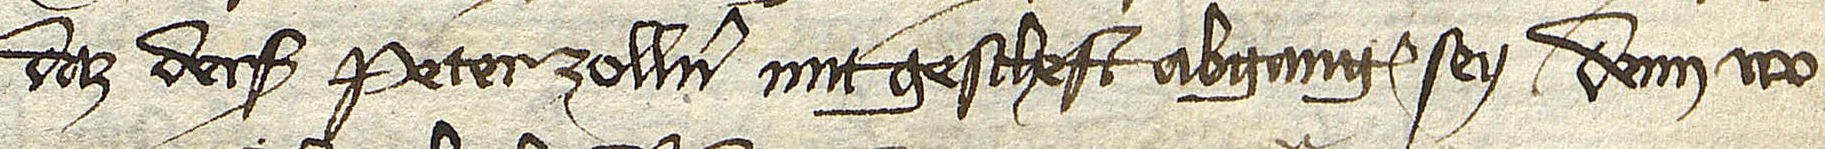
daʒ derſ* Peter ʒolln* mit geſcheft abgang* ſey / Denn wo
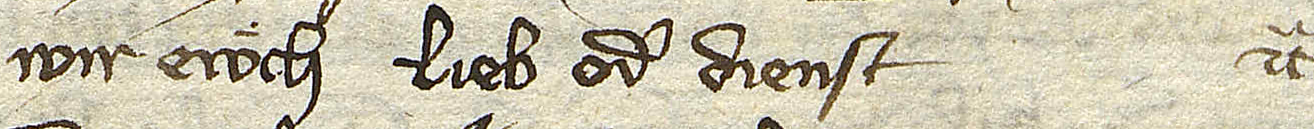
wir ewch lieb od* dienſt ec*
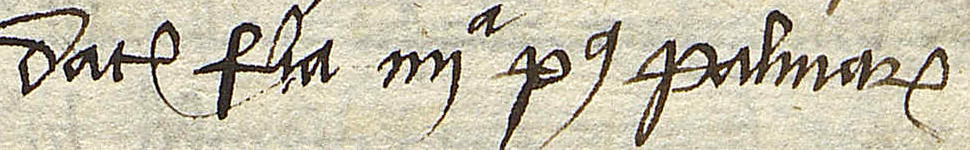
Dat* fia* iiii* p* Palma*
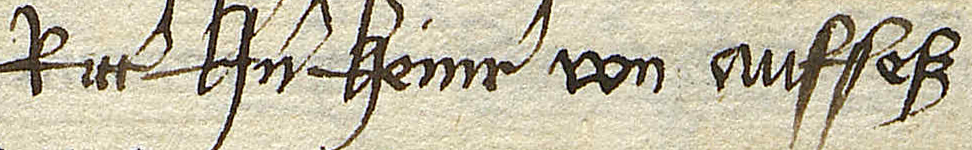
Ritt* H*n Heinr* von aufſeſʒ
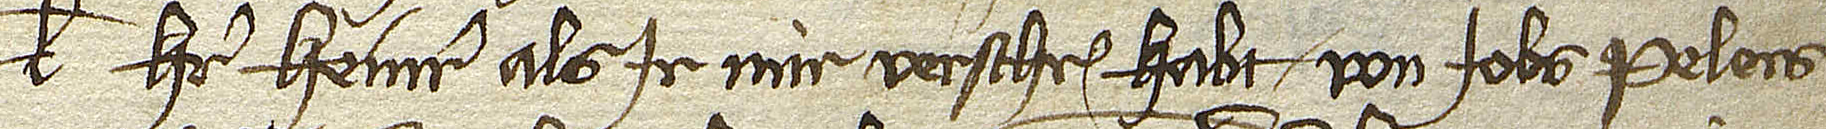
L* h*r heinr* als Ir mir verſchr* habt / von Iobs Pelers
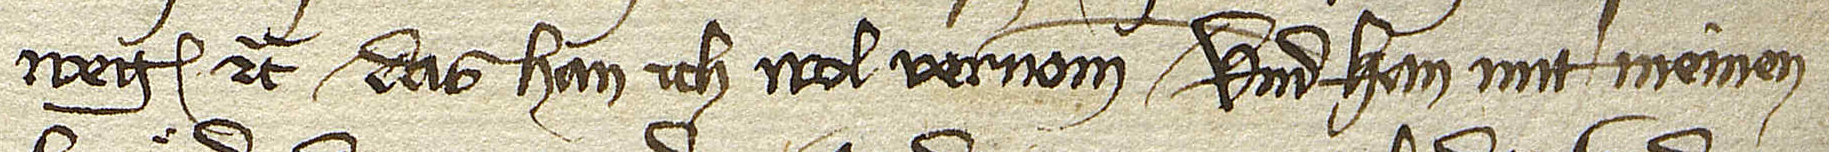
weg* ec* / das han ich wol vernom* / Vnd han mit meinen
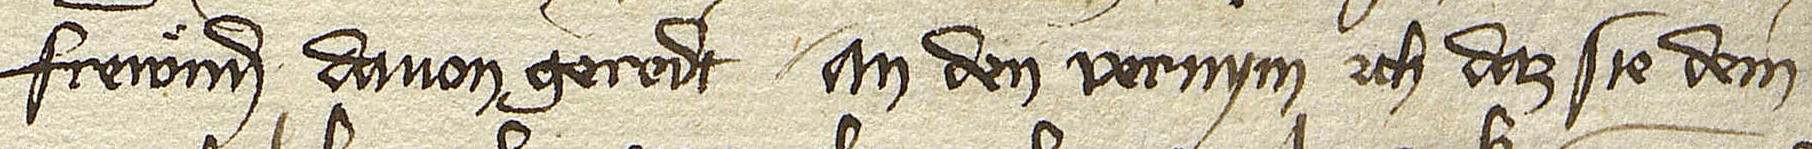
frewnd* dauon geredt / an den vernym ich daʒ ſie dem
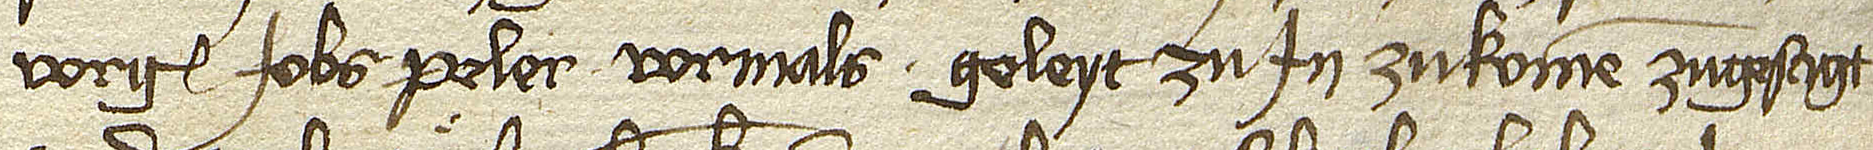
vorg* Iobs Peler . vormals . geleyt ʒu In ʒu kome* ʒugeſagt
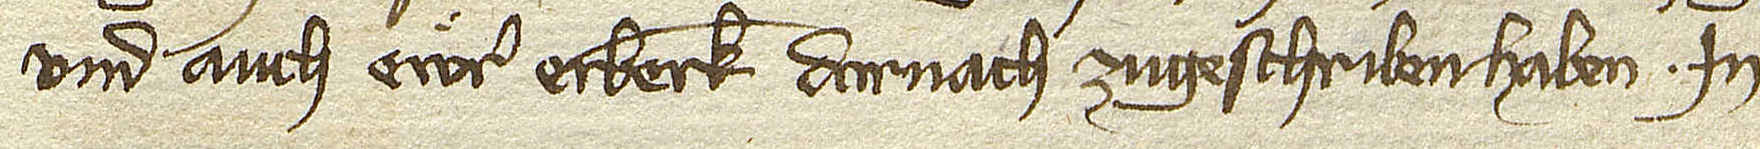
vnd auch ew*r erberk* darnach ʒugeſchriben haben . In
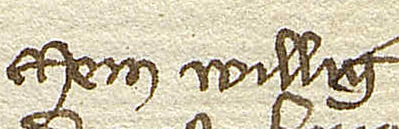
Mein willig*
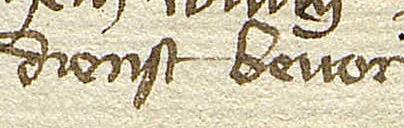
dienſt beuor
